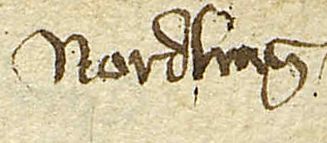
Nordling*
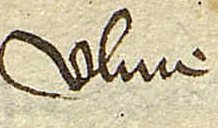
Vlme
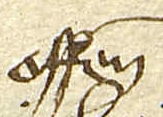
offen*
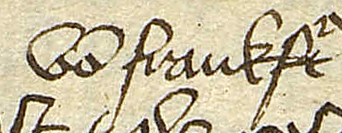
vo* frankf*t
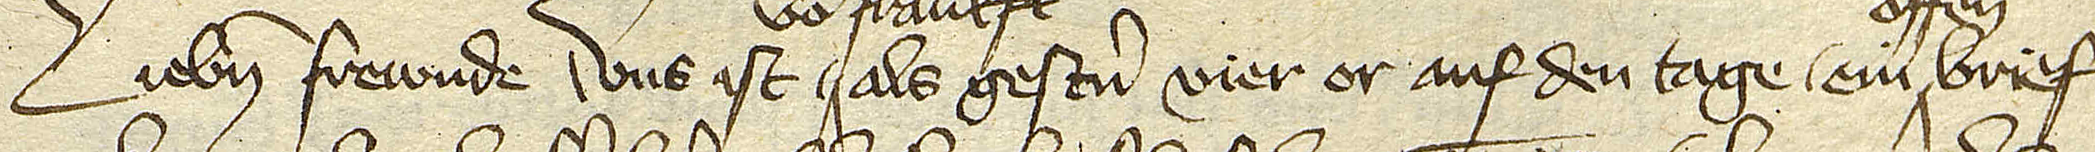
Liebn* frewnde / Vns iſt / als geſtn* vier or auf den tage / ein brief
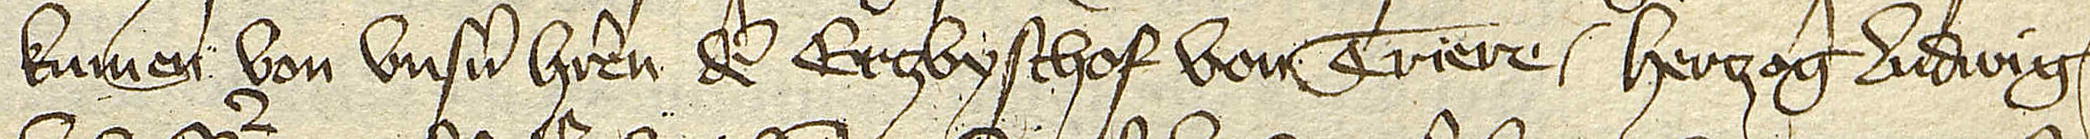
kumen von vnſn* hr*en d* Ercʒbyſchof von Triere / hercʒog Ludwig*
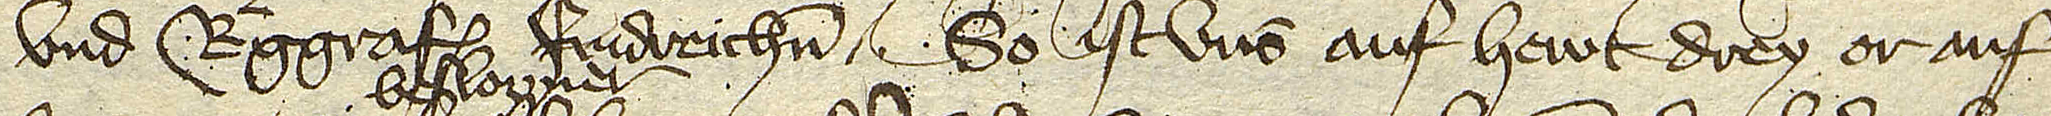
vnd B*ggraf* Fridreichn* / . So iſt vns auf hewt drey or auf
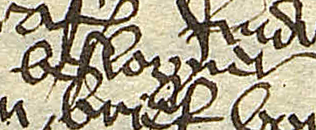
beſloʒʒner
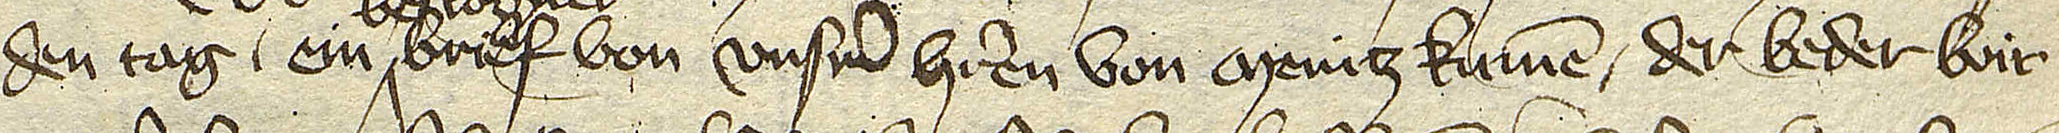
den tag / ein brief von vnſm* hr*en von Meincʒ kume* / der beder wir
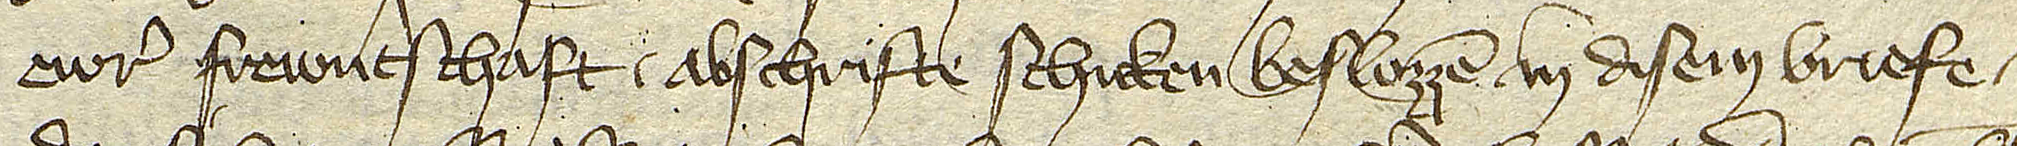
ewr* frewntſchaft / abſchrifte ſchicken beſloʒʒe* in diſem briefe /
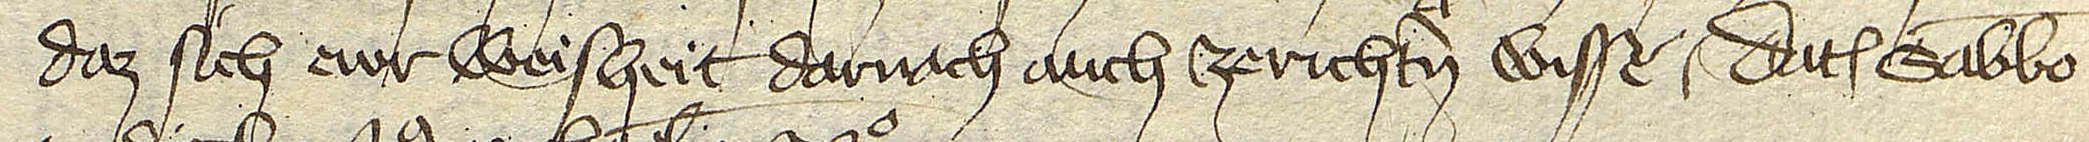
daʒ ſich ewr weiſheit darnach auch cʒerichtn* wiſſe / Dat* Sabbo*
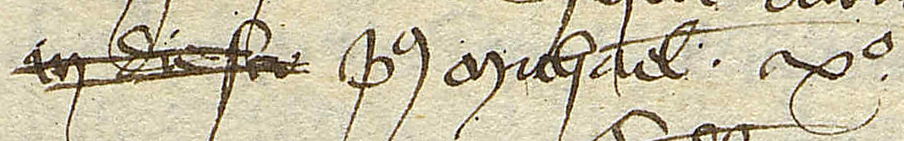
in die ſc p* Michael . x* .
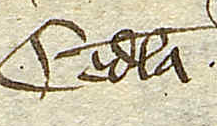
Cedla*
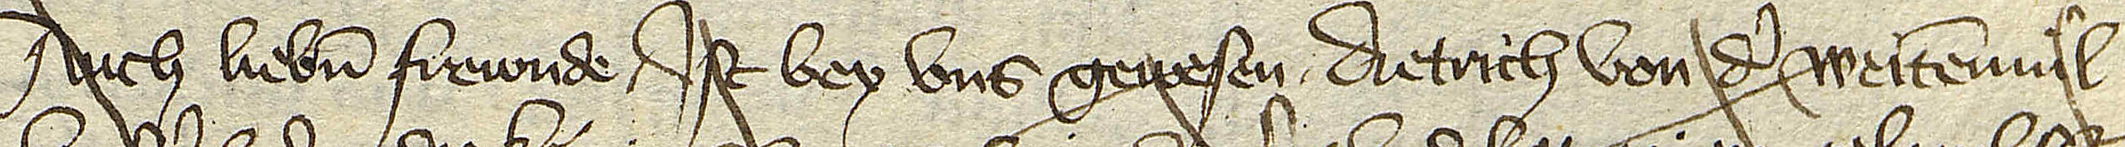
Auch liebn* frewnde / Iſt bey vns geweſen / Dietrich von d* weite*mül
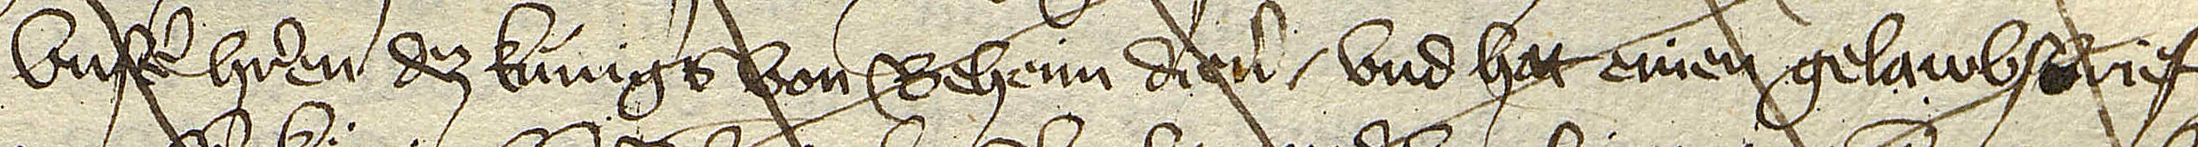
vnſs* hr*en deʒ künigs von Beheim dien* / vnd hat einen gelawbſbrief
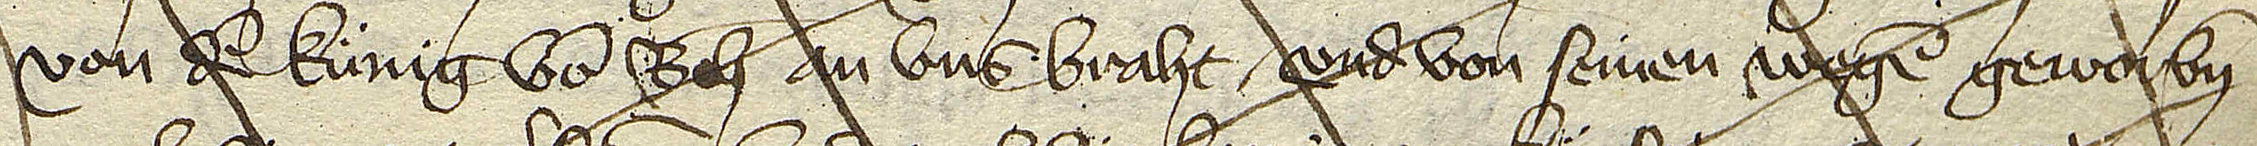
von d* künig vo* Beh* an vns braht / vnd von ſeinen wege* geworbn*
